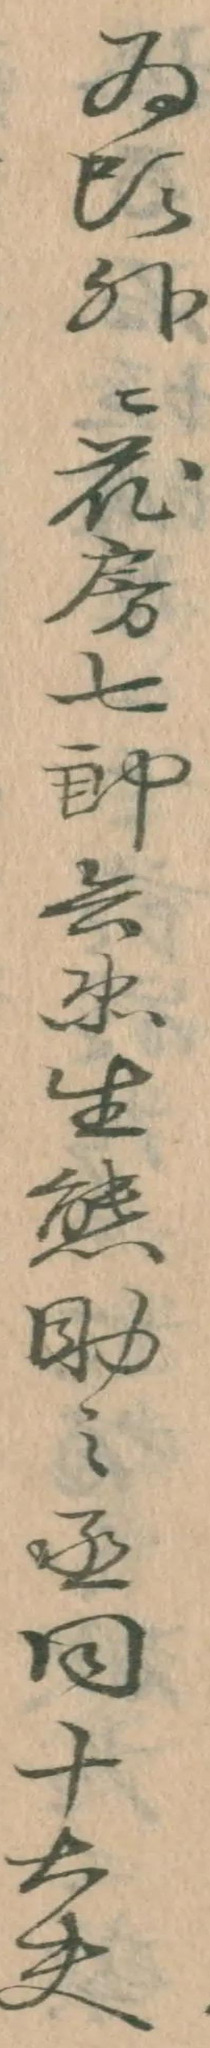為頭外に花房七郎兵衛生熊助之丞同十大夫
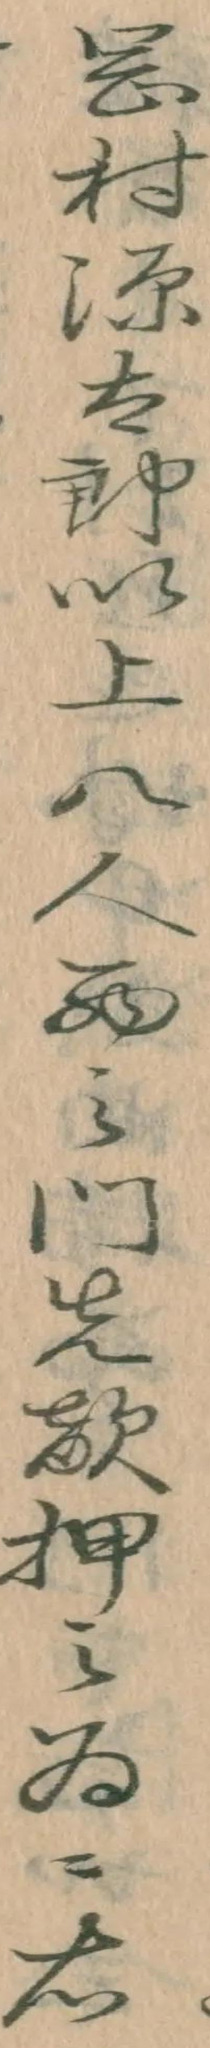岡村源太郎以上八人西之門先敵押之為に右
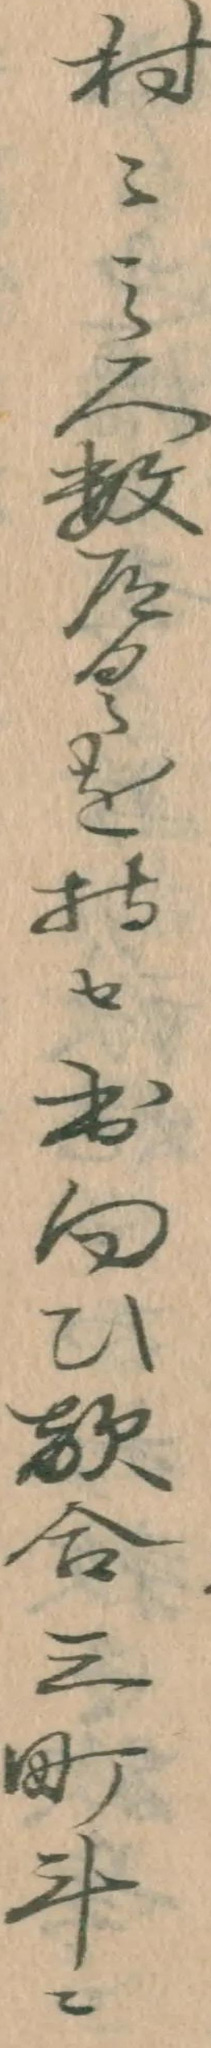村々之人数道具を持せ出向ひ敵合三町斗に
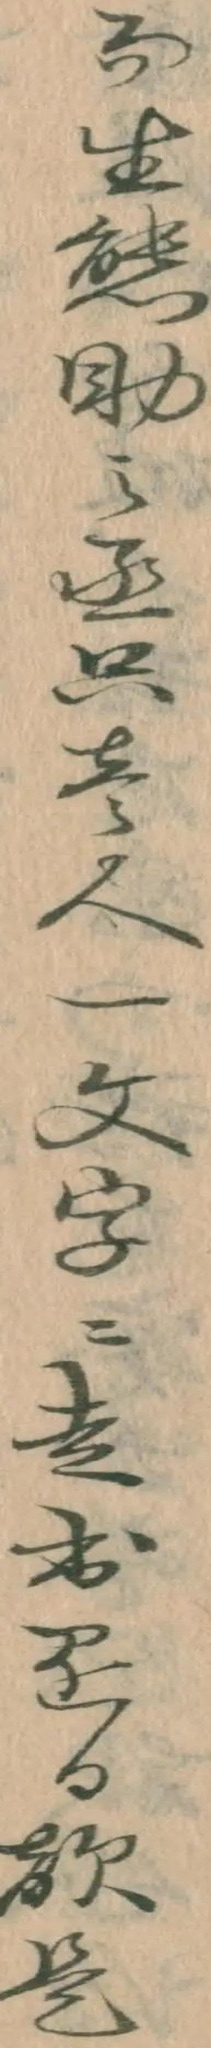而生熊助之丞只壱人一文字に走出懸る敵是
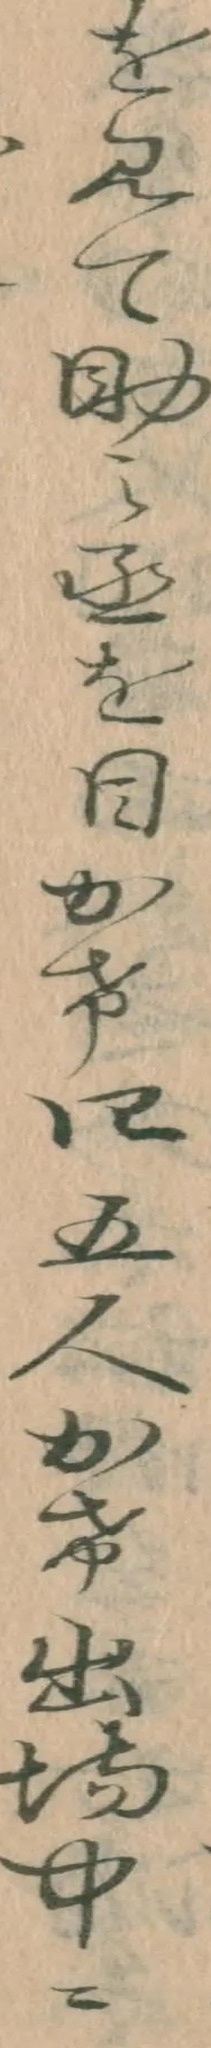を見て助之丞を目かけ四五人かけ出場中に
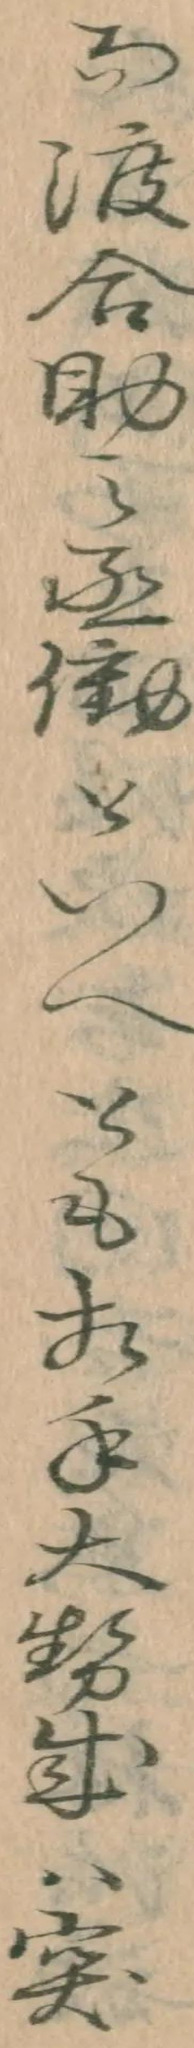而渡合助之丞働といへとも相手大勢成は突
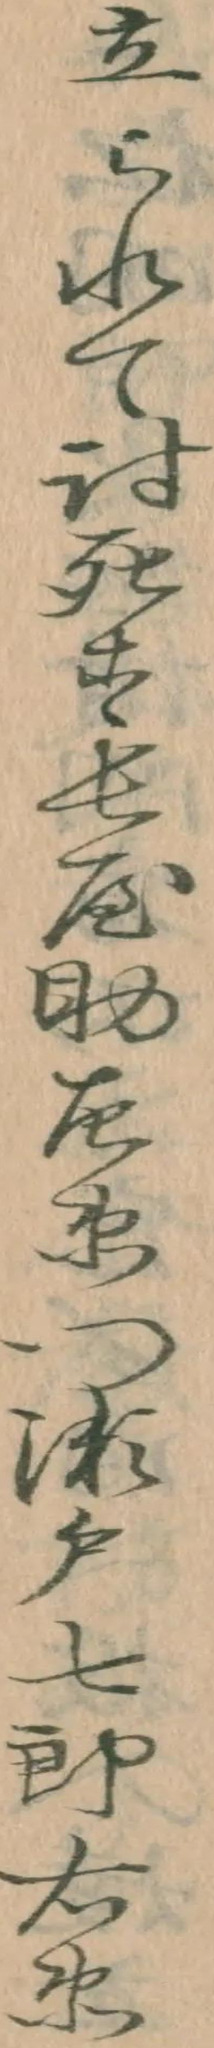立られて討死す長屋助左衛門瀬戸七郎右衛
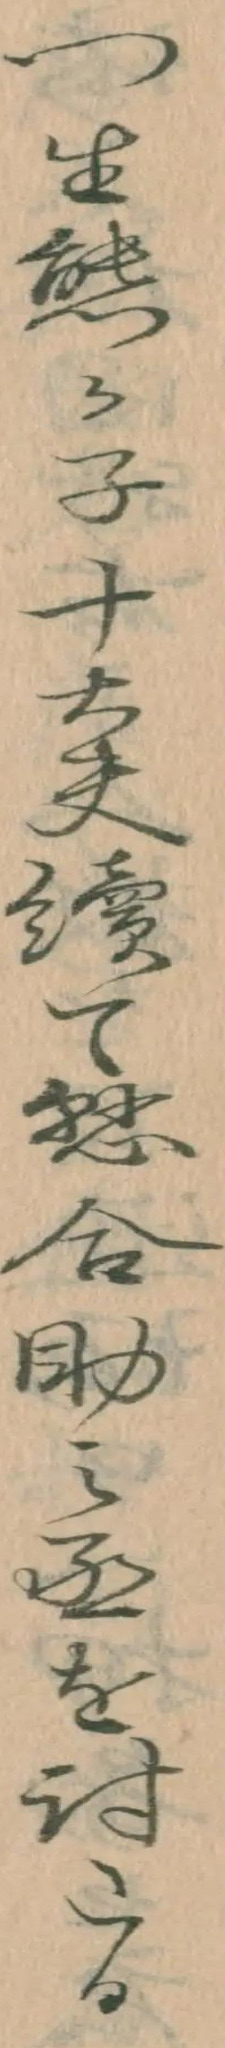門生熊か子十大夫続て懸合助之丞を討たる
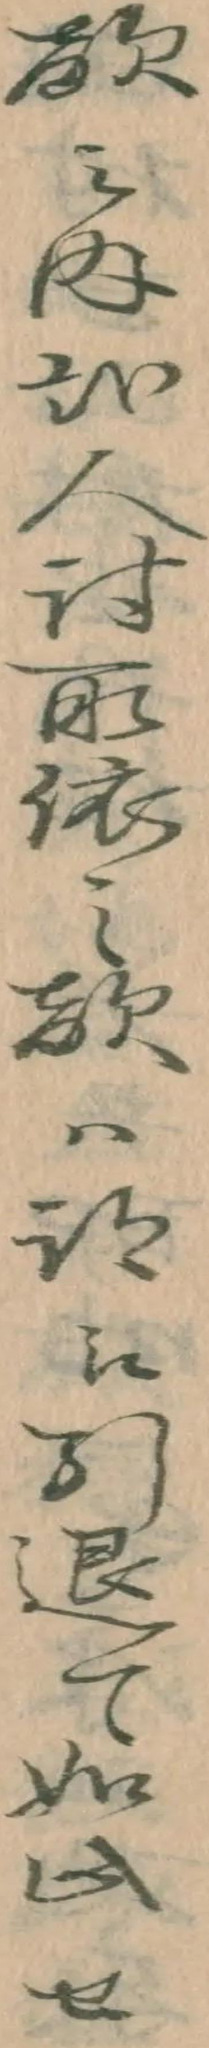敵之内弐人討取依之敵は跡え引退て如此せ
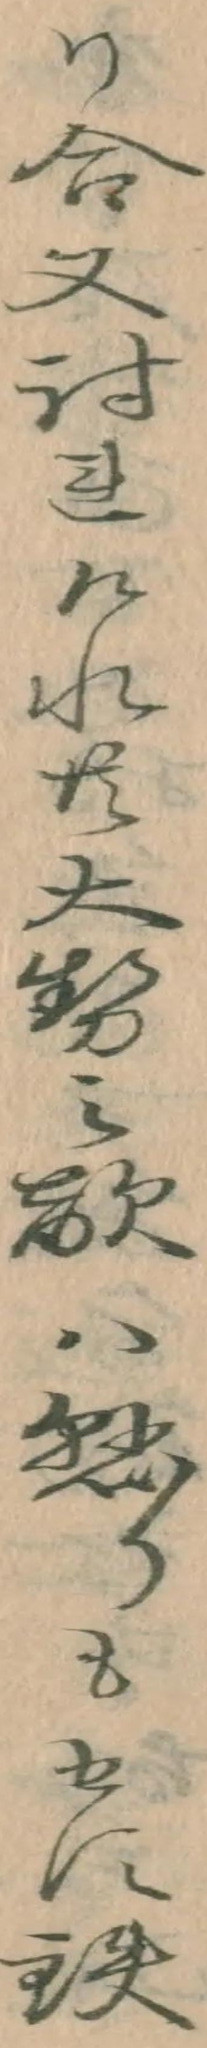り合又討れけれ共大勢之敵は懸りもせす鉄
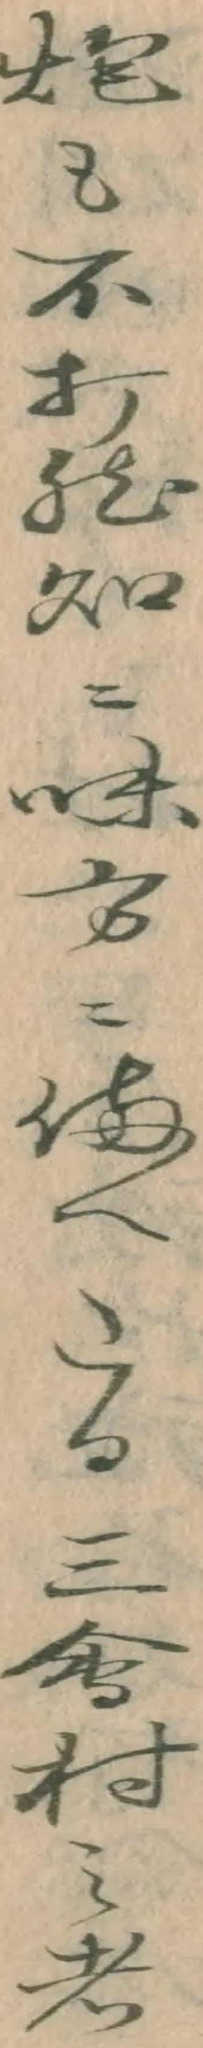炮も不打然処に味方に備へたる三会村之者
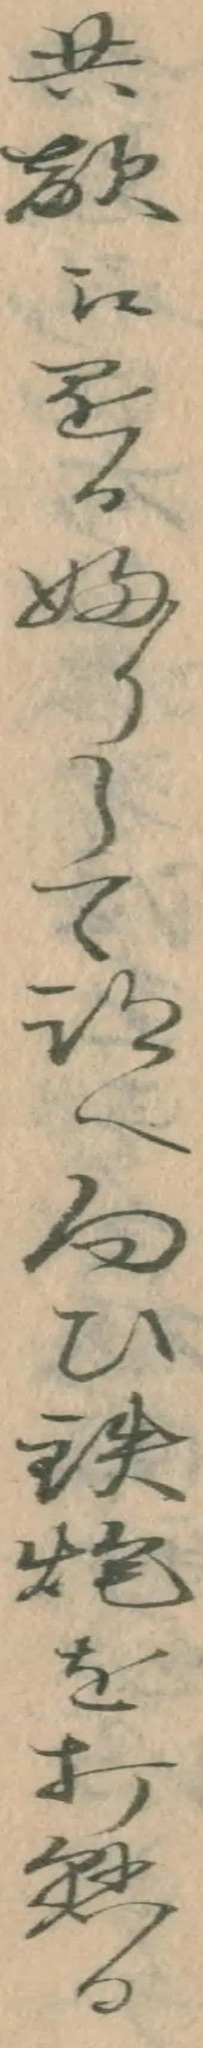共敵え懸るふりして跡へ向ひ鉄炮を打懸る
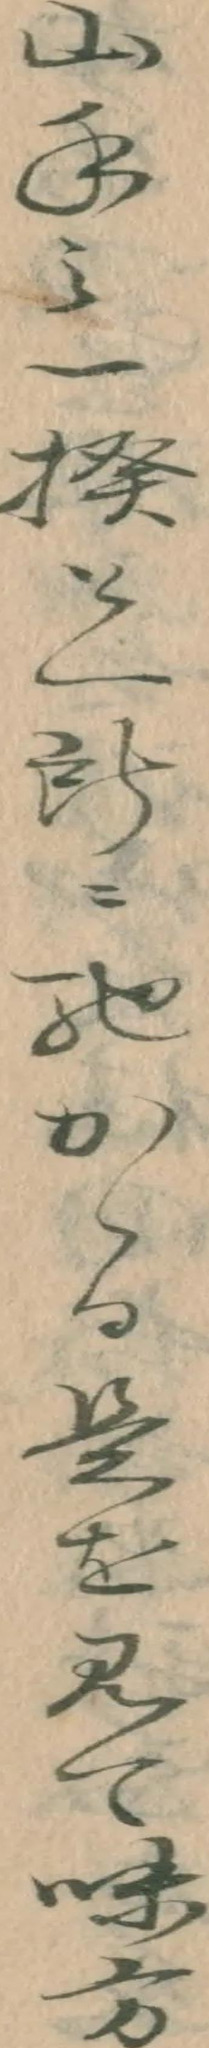山手の一揆と一所に馳かゝる是を見て味方
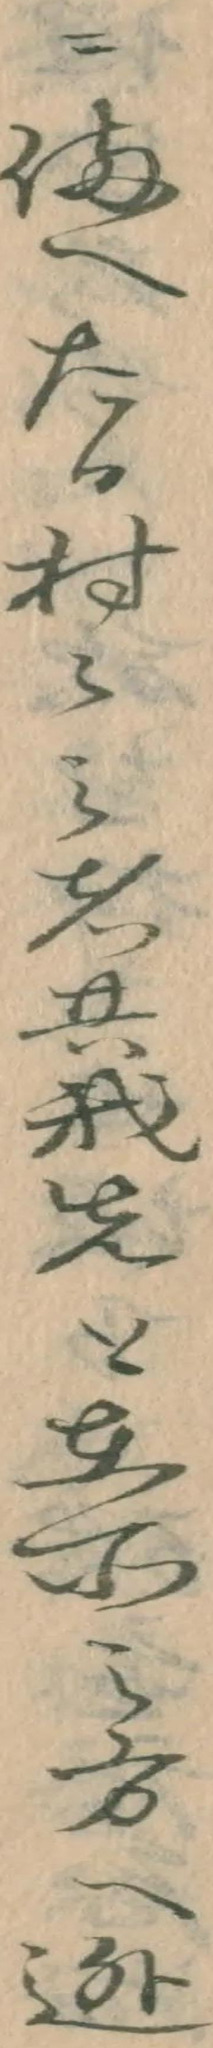に備へたる村々之者共我先と在所之方へ逃
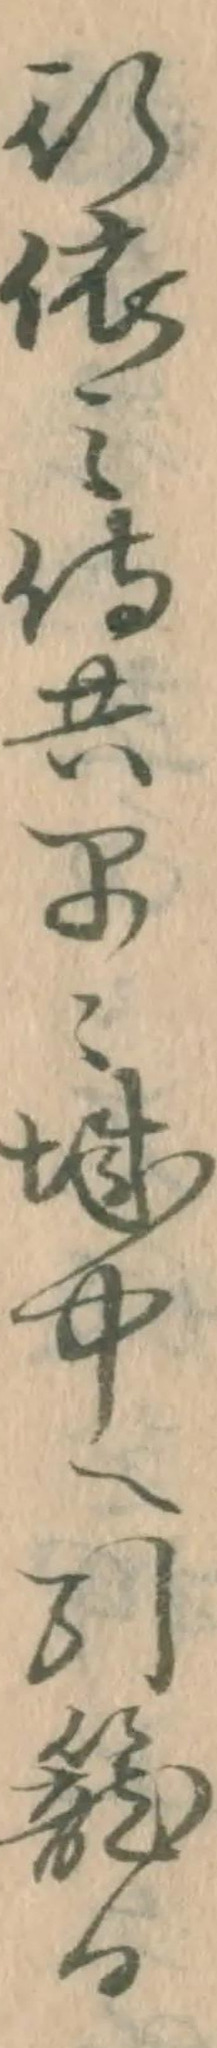行依之侍共早々城中へ引籠る
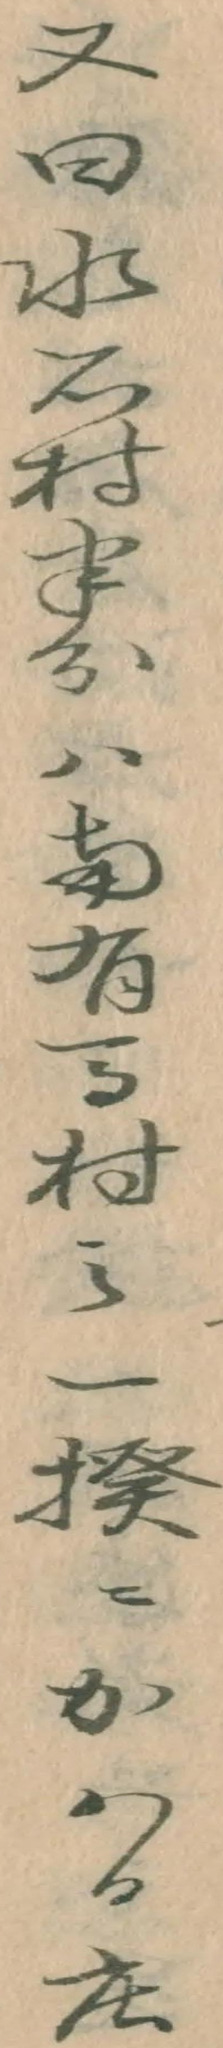又日水石村半分は南有馬村之一揆にかはる庄
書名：切支丹御退治記 49巻. [1]
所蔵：国立国会図書館 National Diet Library, JAPAN
